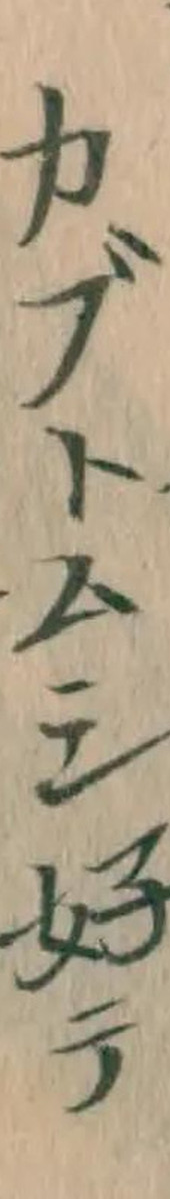カブトムシ好テ
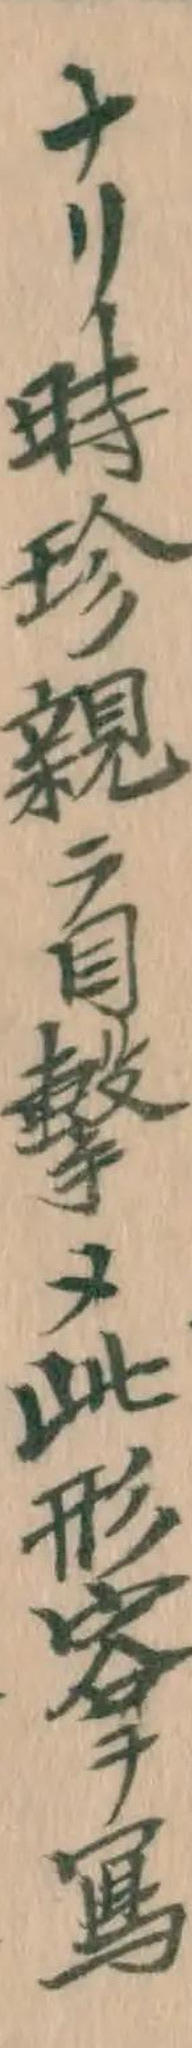ナリ時珍親ラ目撃シテ此形容ヲ冩
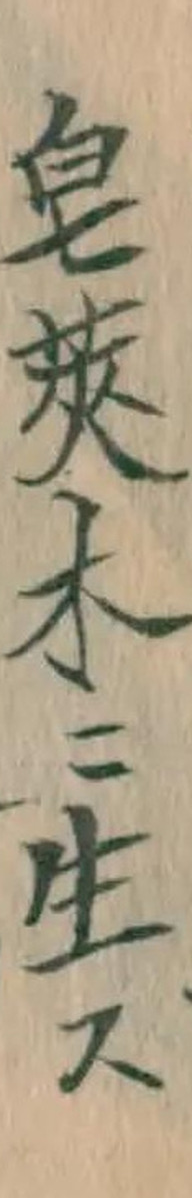皂莢木ニ生ス
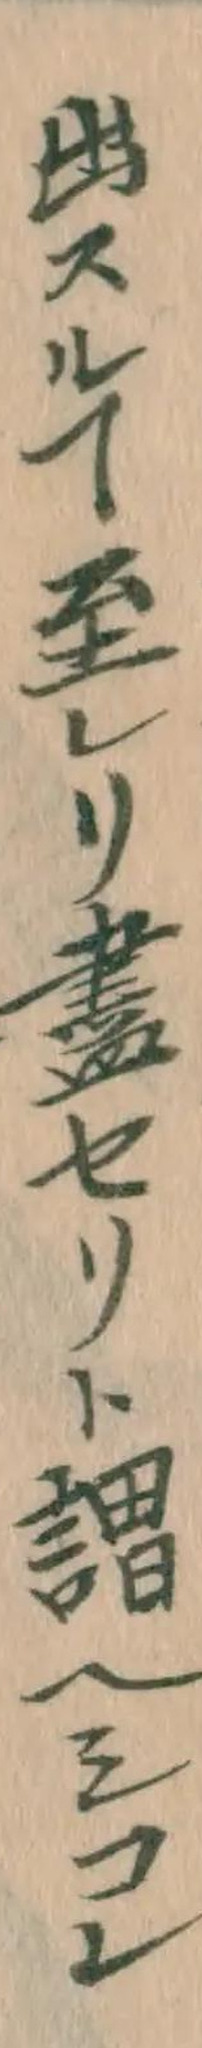出スルコト至レリ盡セリト謂ヘシコレ
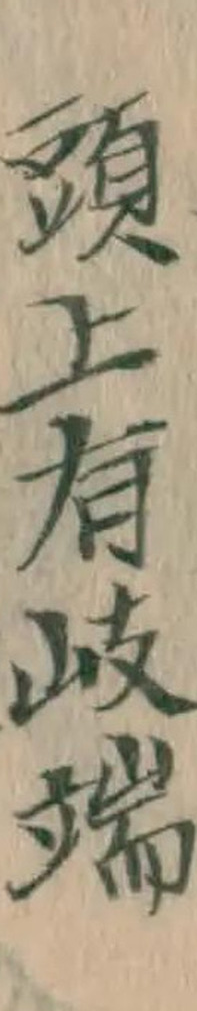頭上有岐端
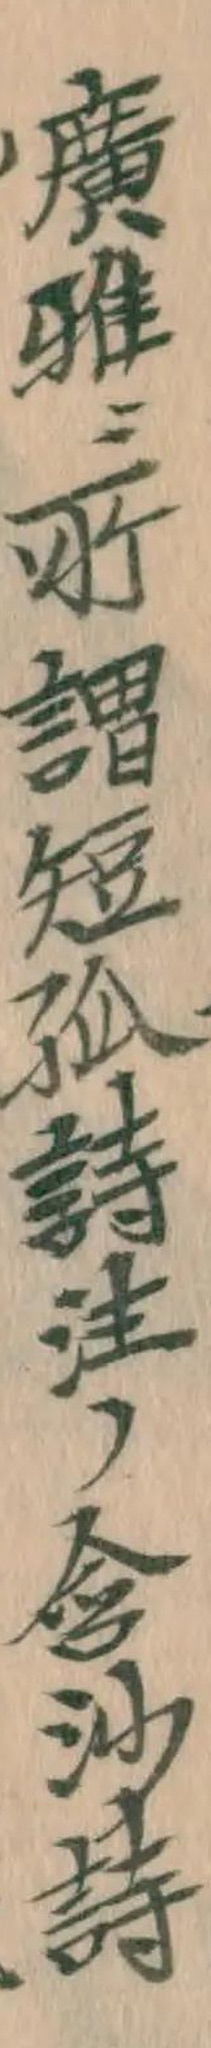廣雅ニ所謂短孤詩注ノ含沙詩
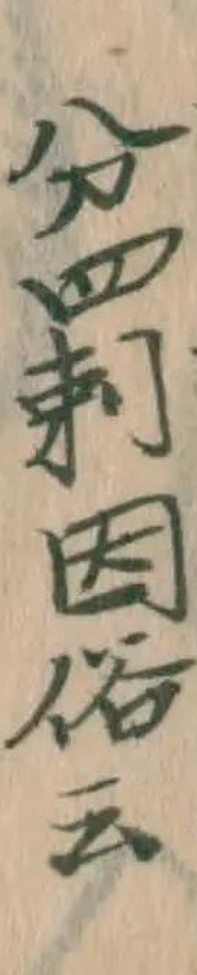分四刺因俗云
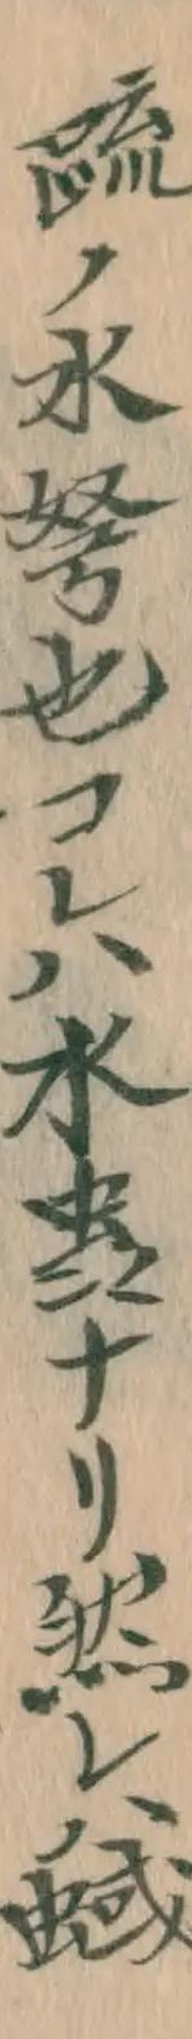疏ノ水弩也コレハ水蟲ナリ然レハ蜮
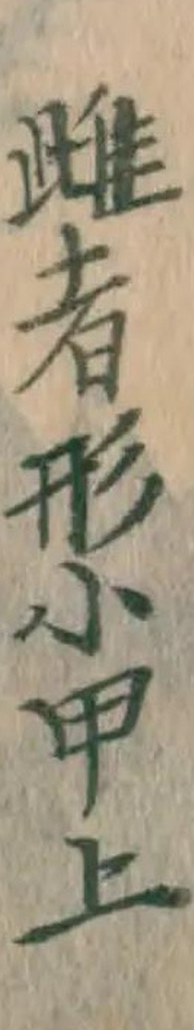雌者形小甲上
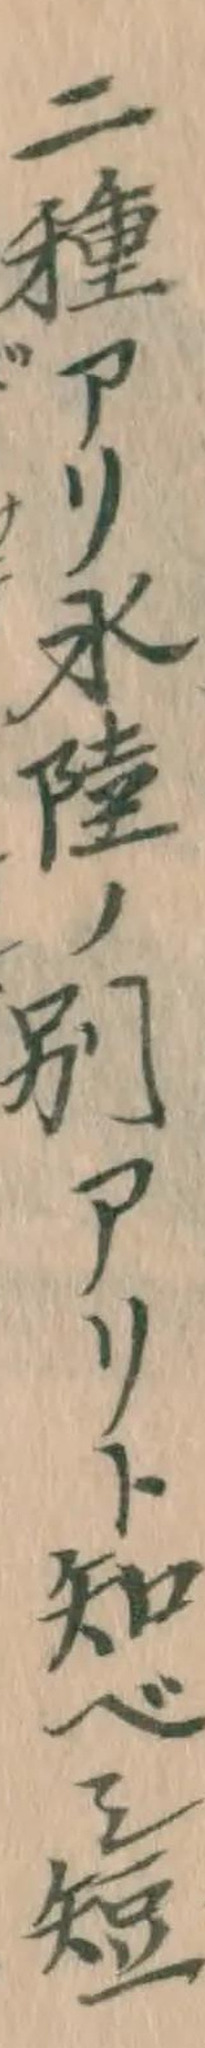二種アリ水陸ノ別アリト知ベシ短
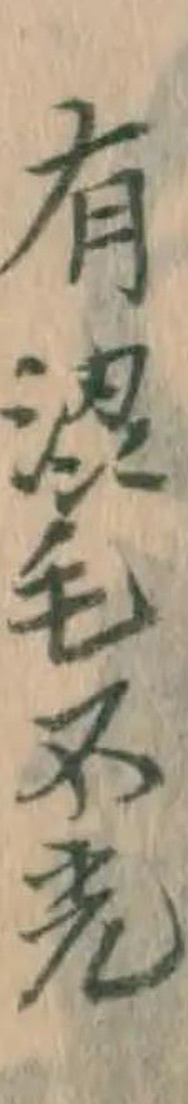有澀毛不光
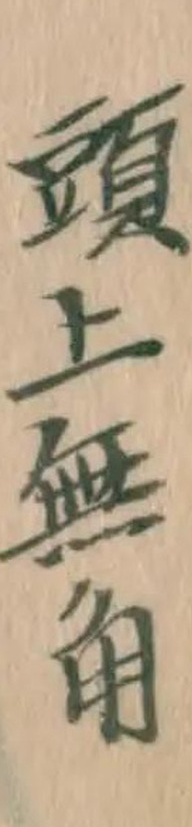頭上無角
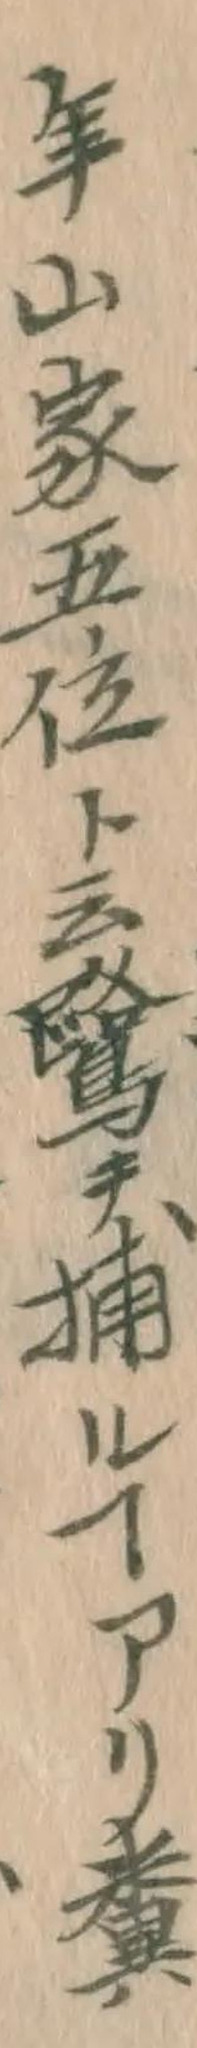年山家五位ト云鷺ヲ捕ルコトアリ糞
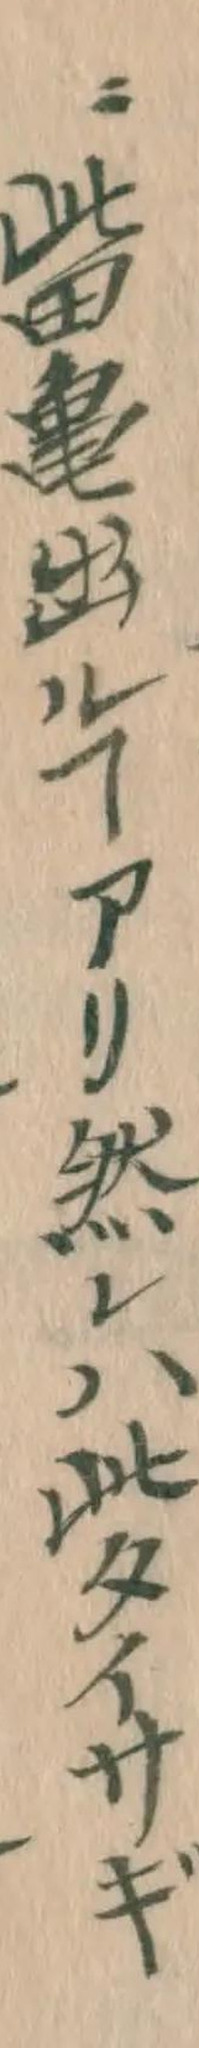ニ此田亀出ルコトアリ然レハ此タイサギ
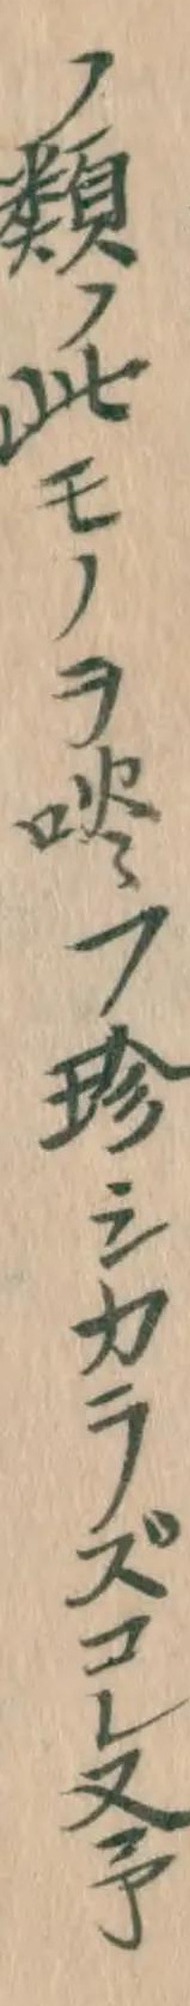ノ類ノ此モノヲ啖フ珍シカラズコレ又予
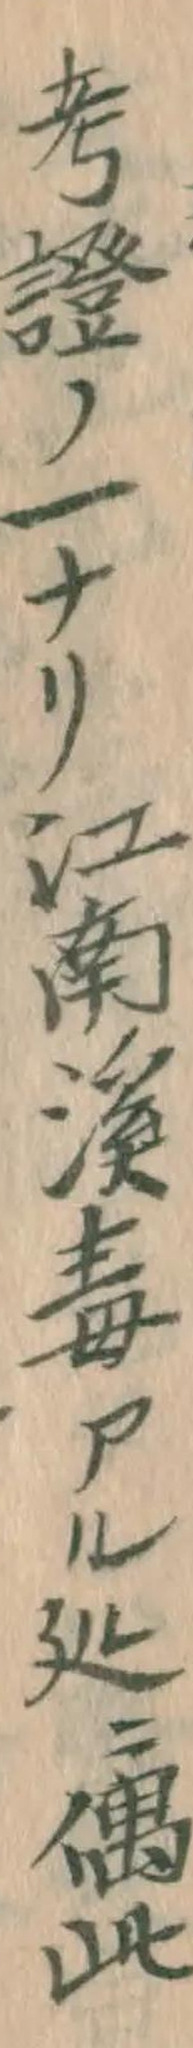考證ノ一ナリ江南溪毒アル処ニ偶此
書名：千蟲譜 3巻. [1]
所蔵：国立国会図書館 National Diet Library, JAPAN
